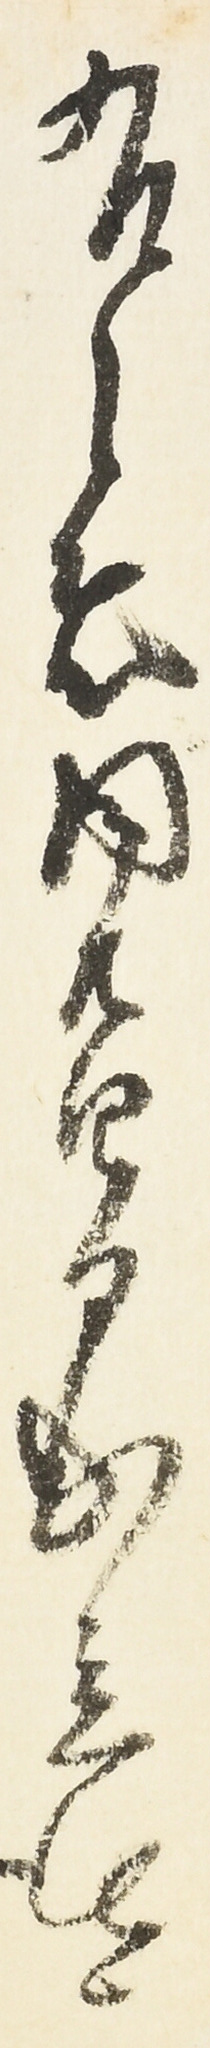右之者同廿四日出立仕候
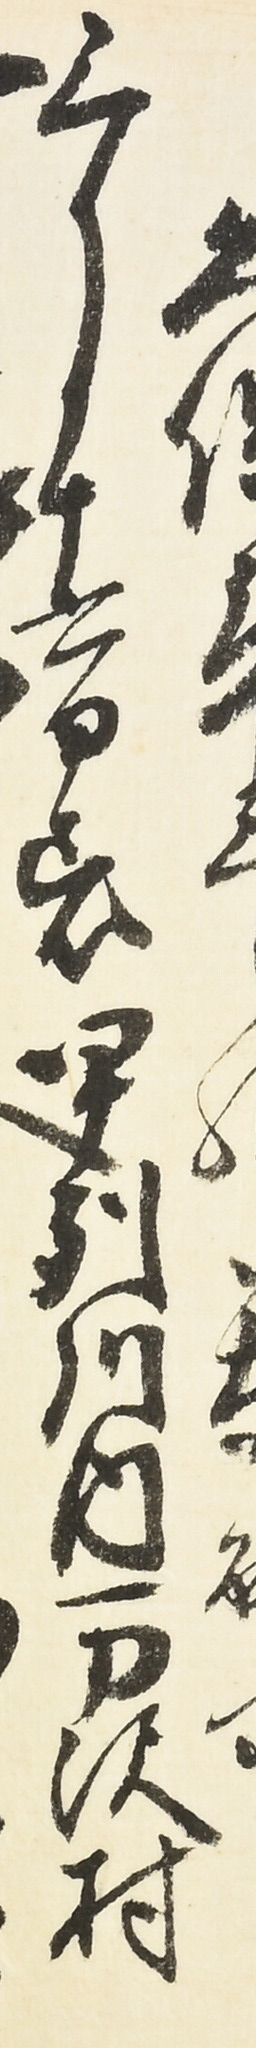三月十六日着甲州川内万沢村
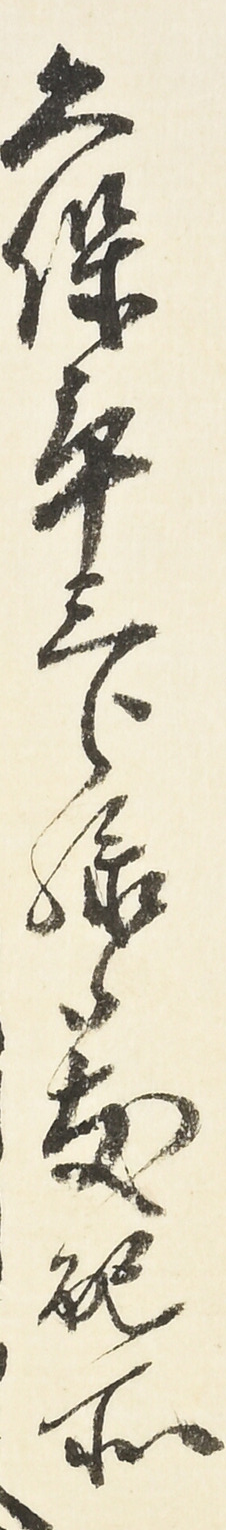久保平三郎様御支配所
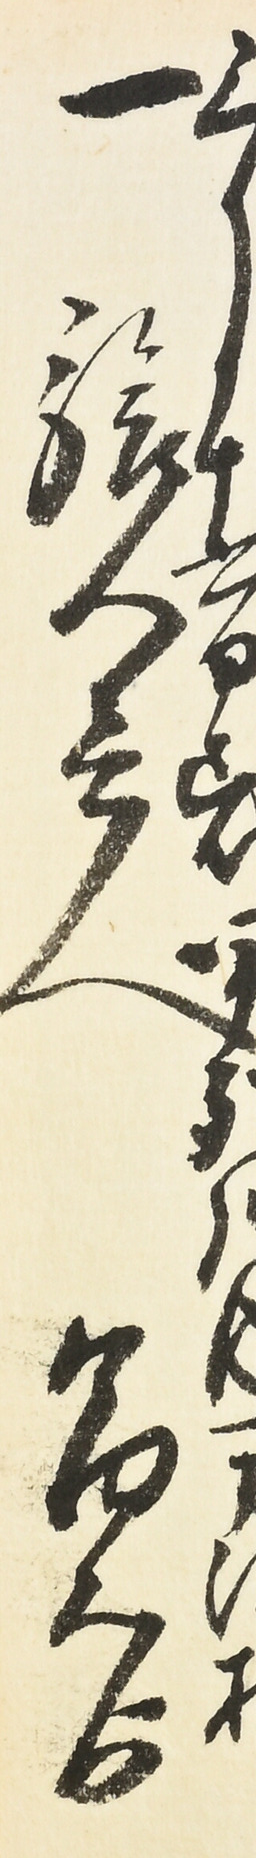一旅人壱人喜三郎
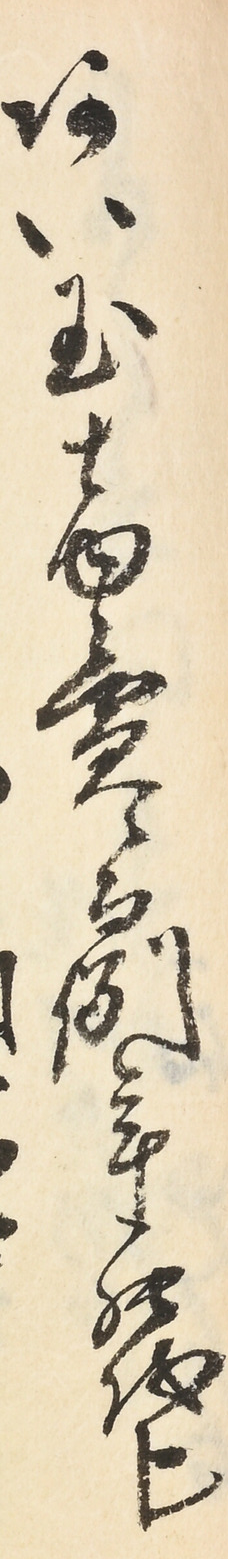形商売ニ而例年罷越申候
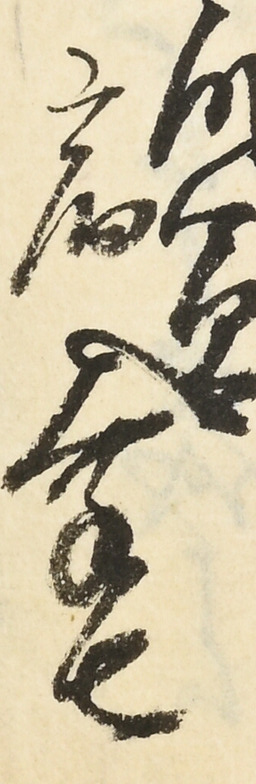宿幸七
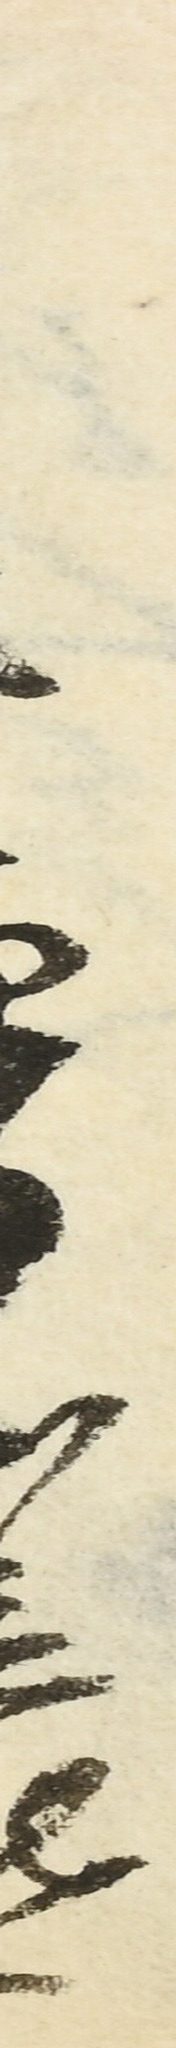右之者同廿四日出立仕候

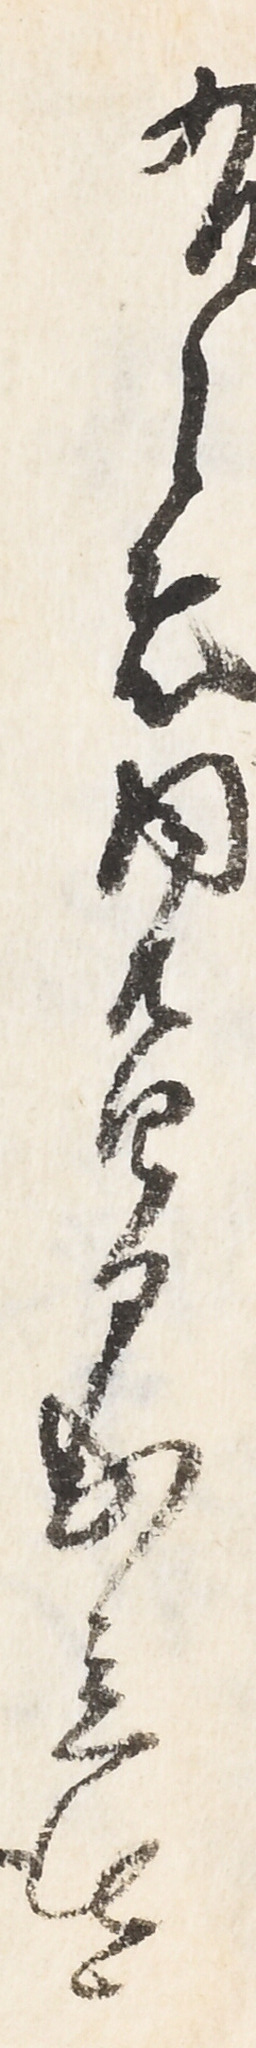右之者同廿四日出立仕候
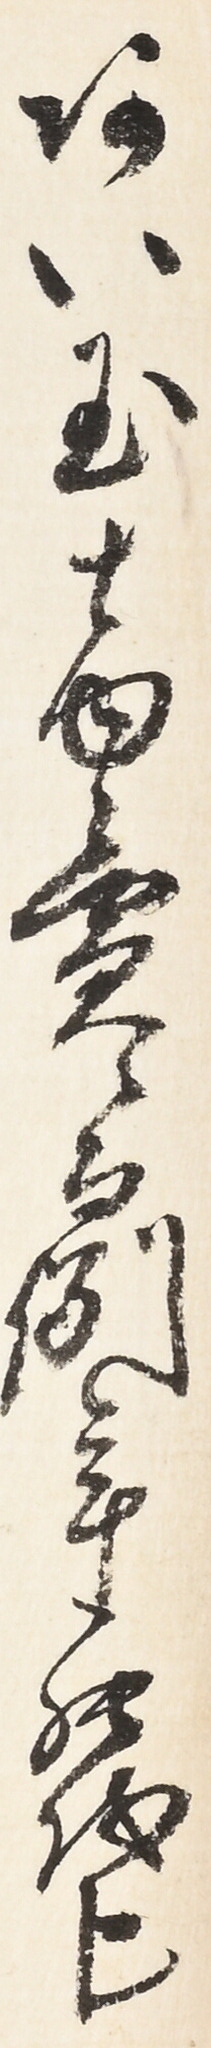あい玉商売ニ而例年罷越申候
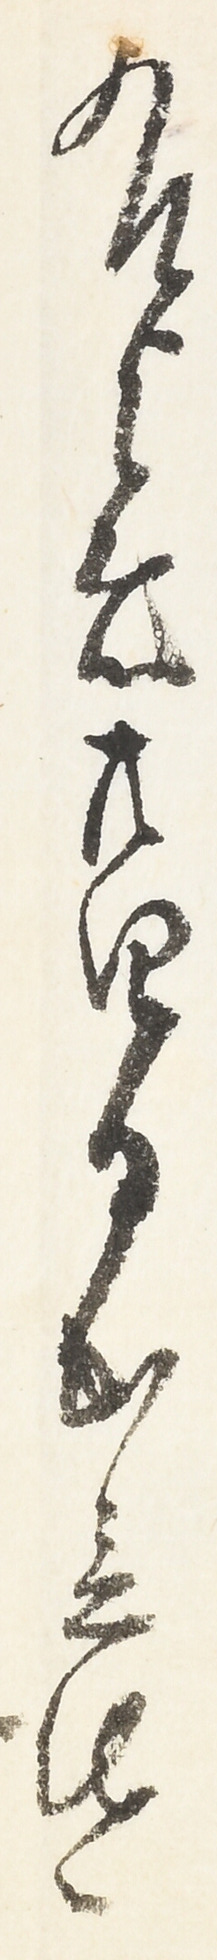右之者廿四日出立仕候
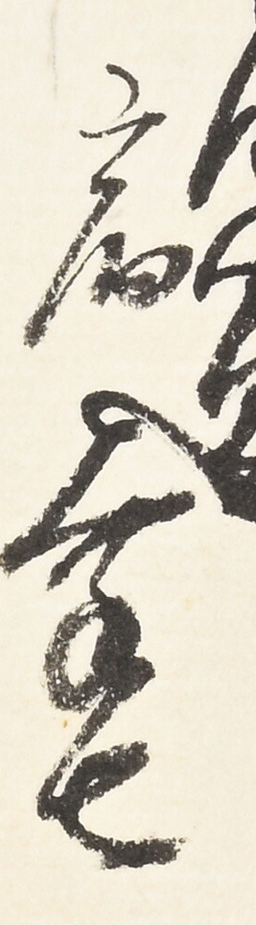宿幸七
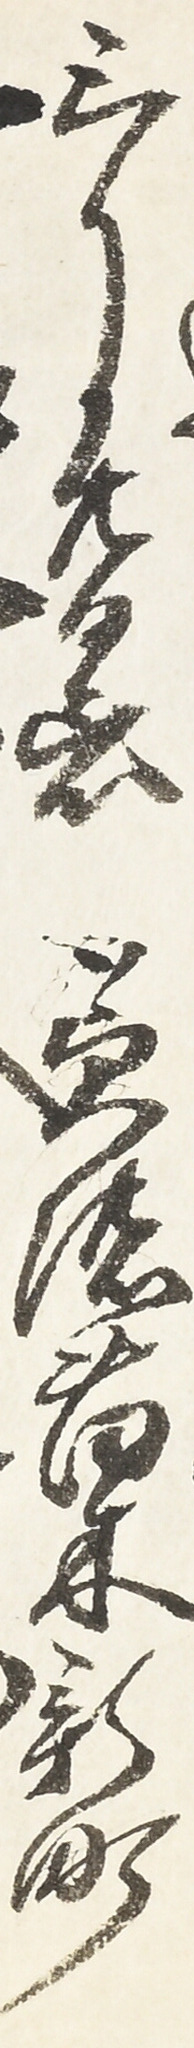三月廿日着美濃苗木新町
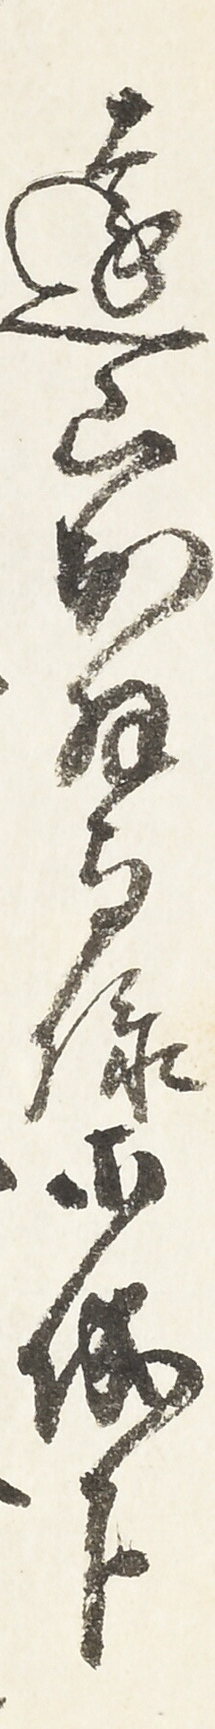遠山出羽守様御城下
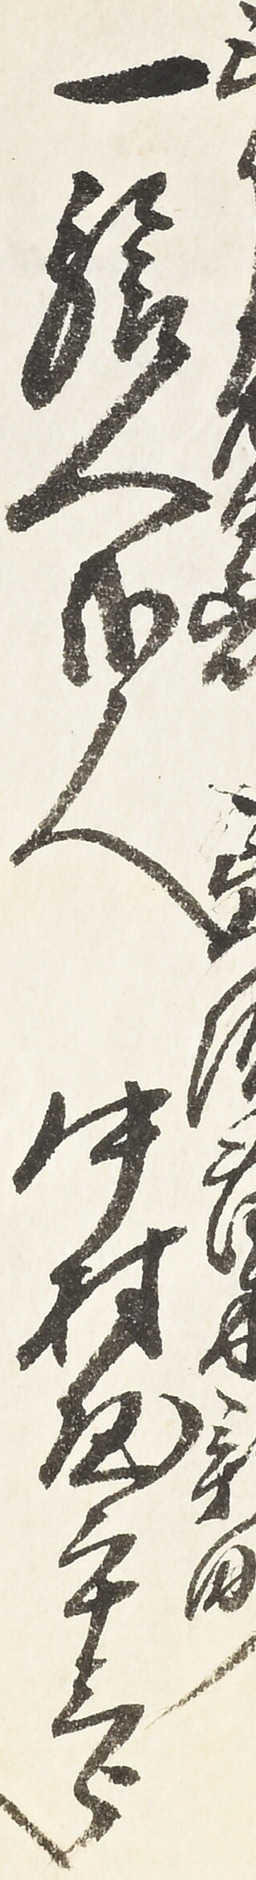一旅人弐人中村屋平三郎
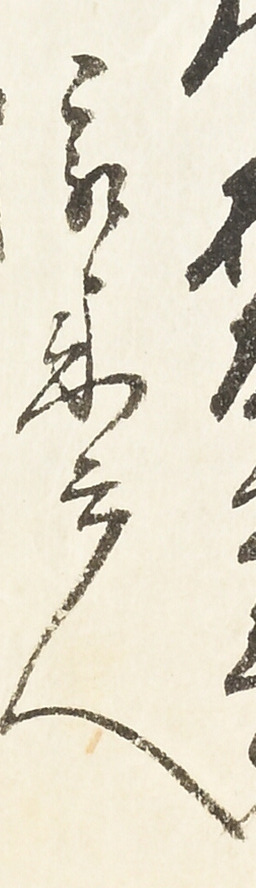家来壱人
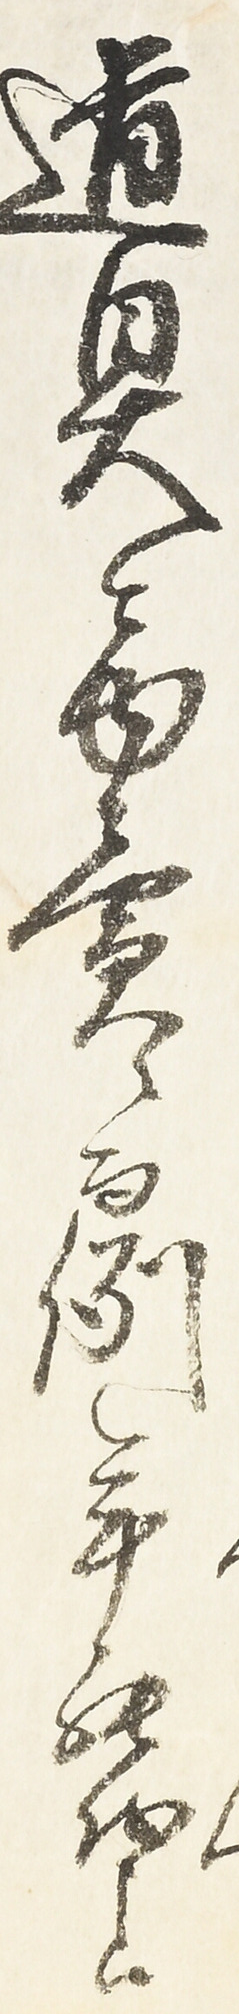道具商売ニ而例年罷越申候
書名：町中旅人泊控帳
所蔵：伊那市立高遠町図書館・合同会社AMANE
